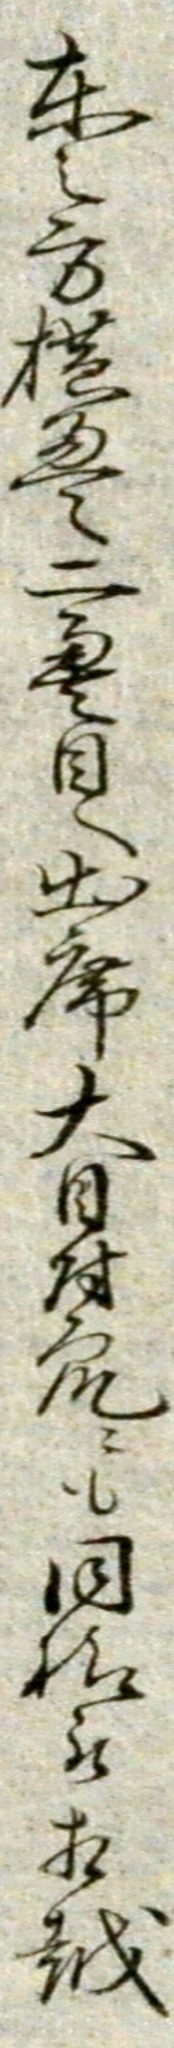東之方横畳二畳目へ出席大目付衆ニも同様被相越
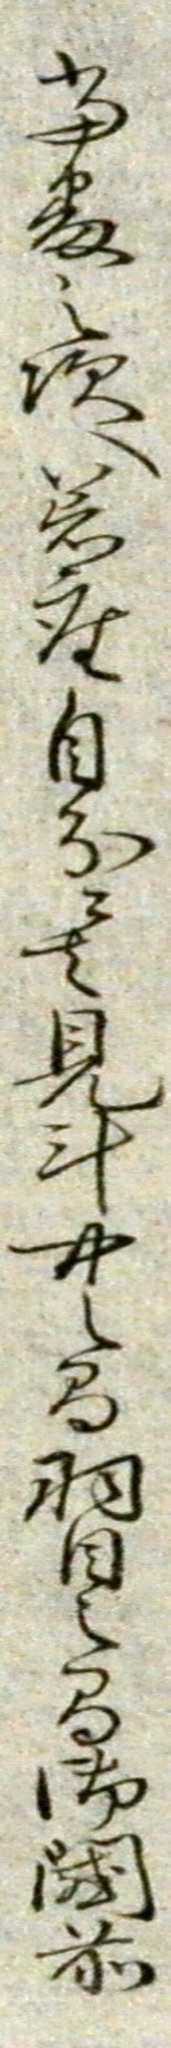当番之次へ着座自分ニ者見計中之間羽目之間御閾前
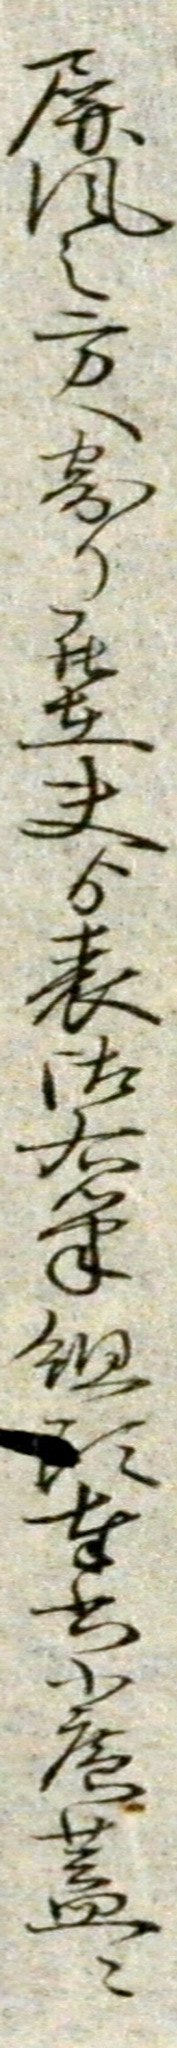屏風之方へ寄り罷在夫ゟ表御右筆組頭奉書小広蓋ニ
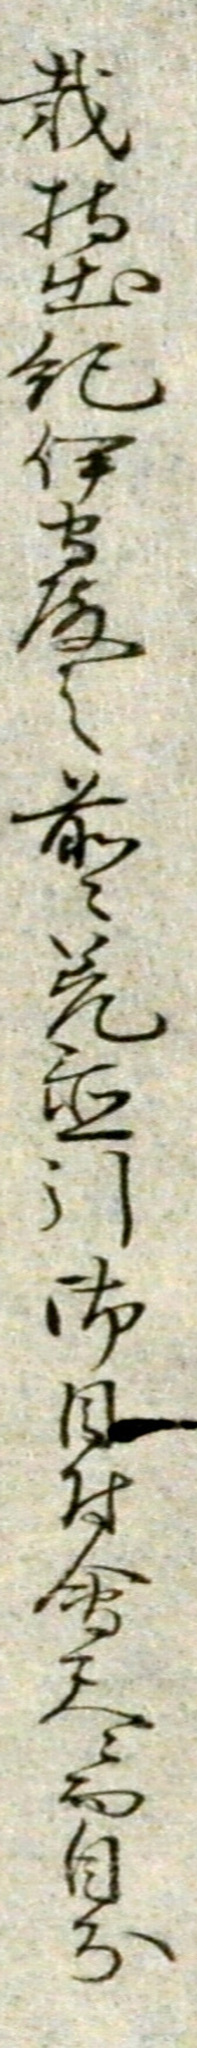載持出紀伊守殿之前々差置引御目付会尺ニ而自分
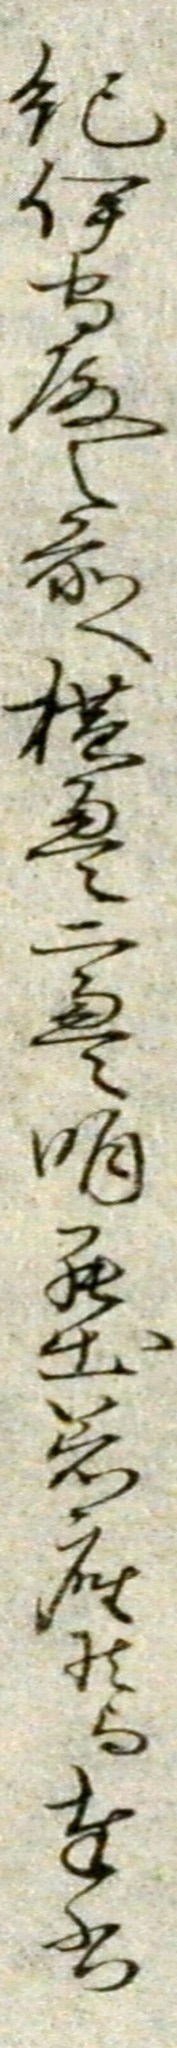紀伊守殿之前へ横畳二畳明罷出着座候而奉書
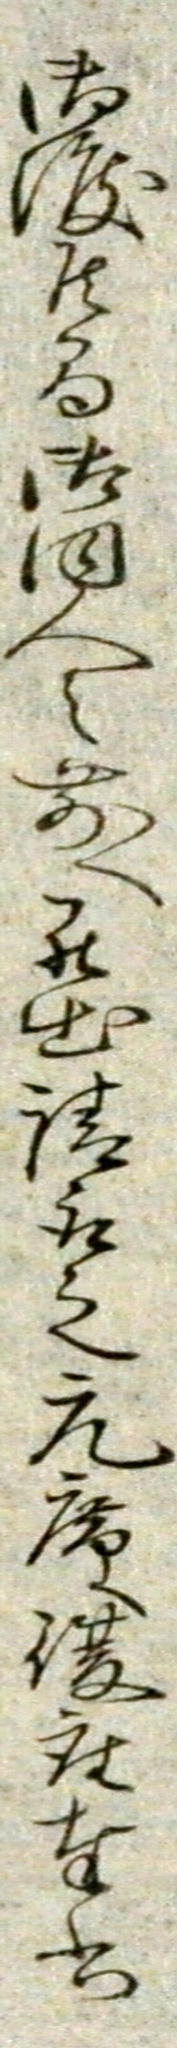御渡候間御同人之前へ罷出請取之元席へ復座奉書
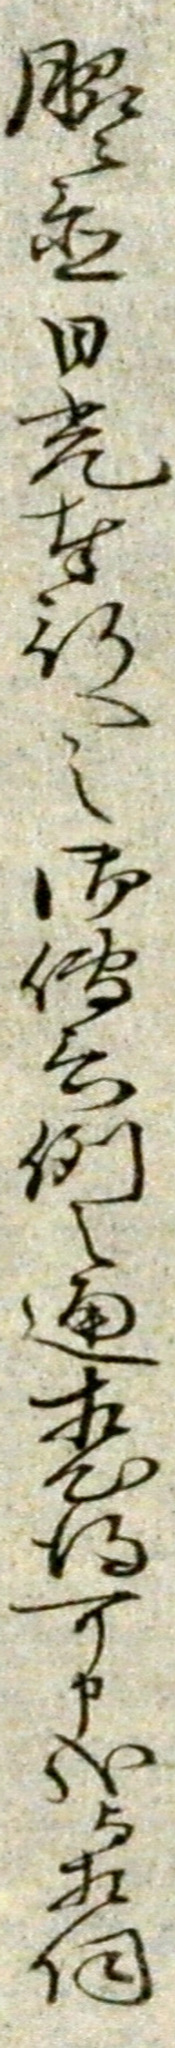脇ニ置日光奉行へ之御伝言例之通相心得可申哉と相伺
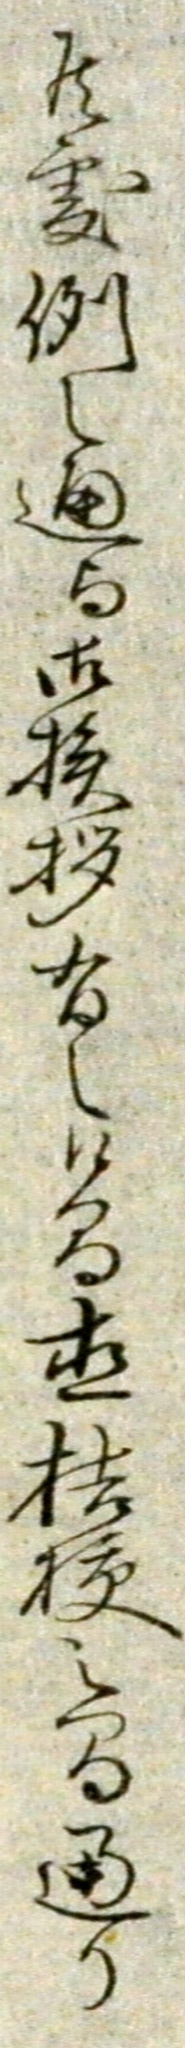候処例之通と御挨拶有之候間直桔梗之間通り
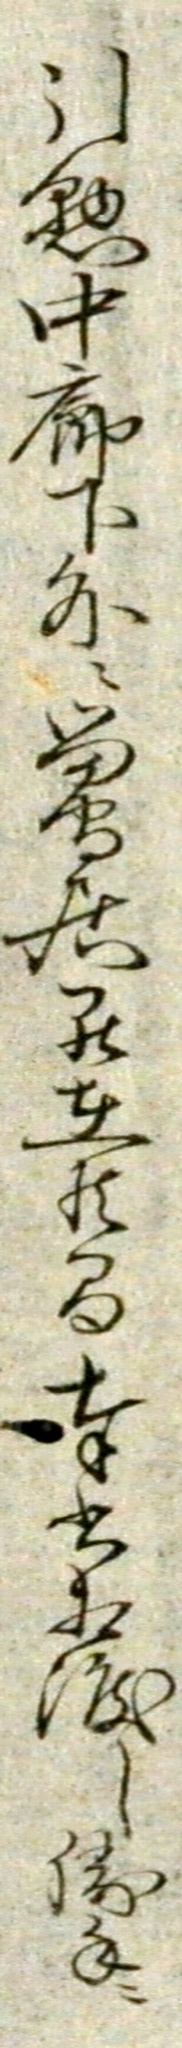引懸中廊下外ニ留守居罷在候間奉書相渡し勝手ニ
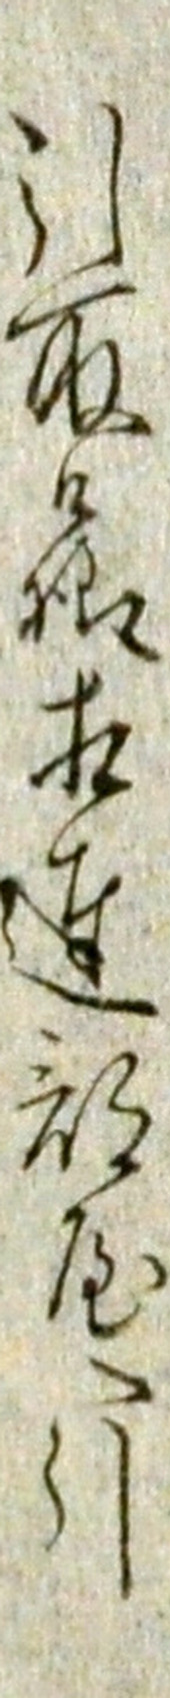引取候様相達部屋へ引
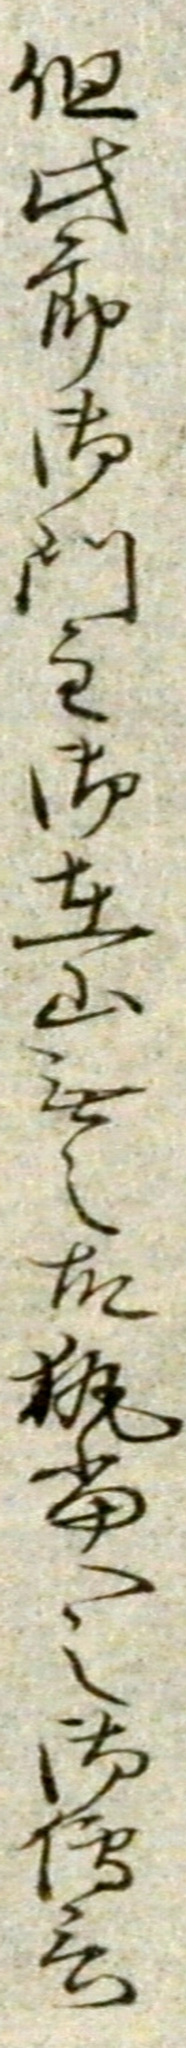但此節御門主御在山無之故執当へ之御伝言
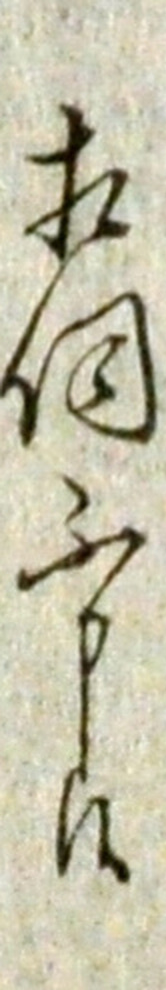相伺不申候
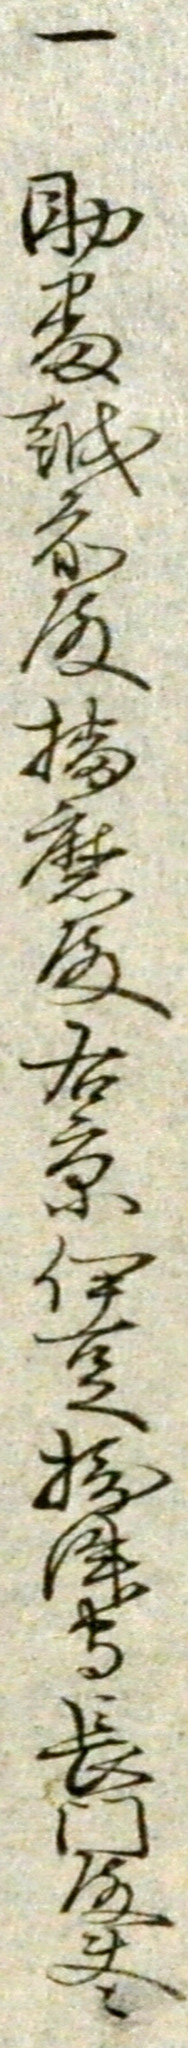一助番越前殿播磨殿右京伊豆摂津守長門殿夫々
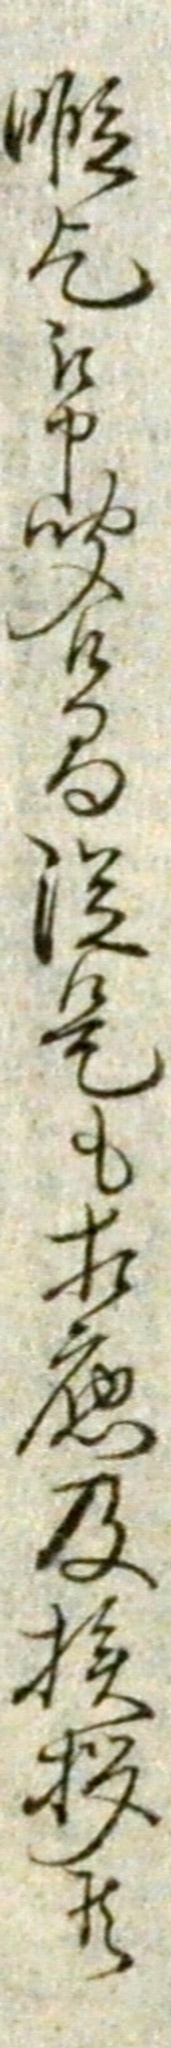暇乞被申聞候間従是も相応及挨拶候
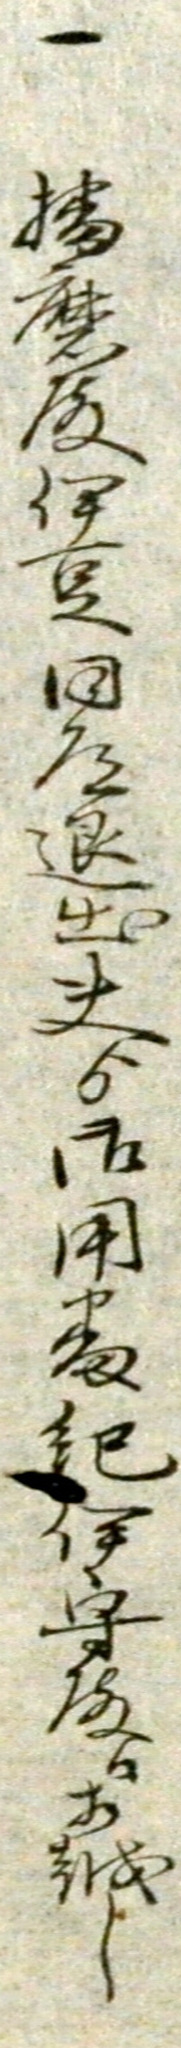一播磨殿伊豆同道退出夫ゟ御用番紀伊守殿江相越し
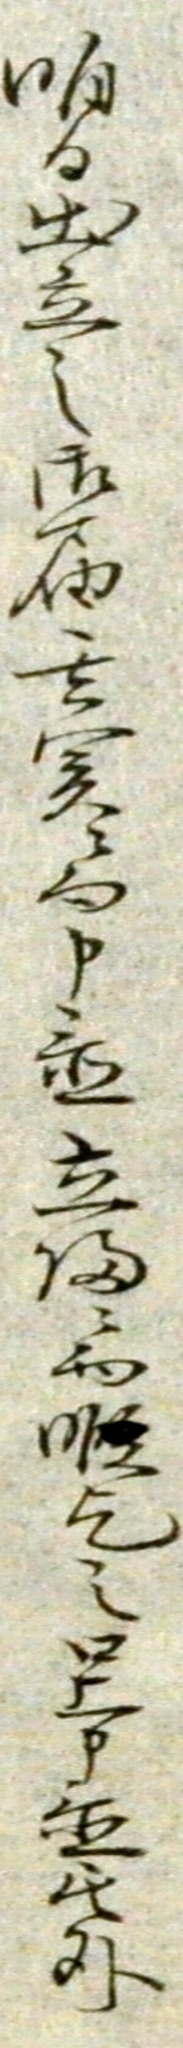昨日出立之御届玄関ニ而申置立帰ニ而暇乞之口上申置其外
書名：日光御名代相勤候節ノ留
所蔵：伊那市立高遠町図書館・合同会社AMANE
